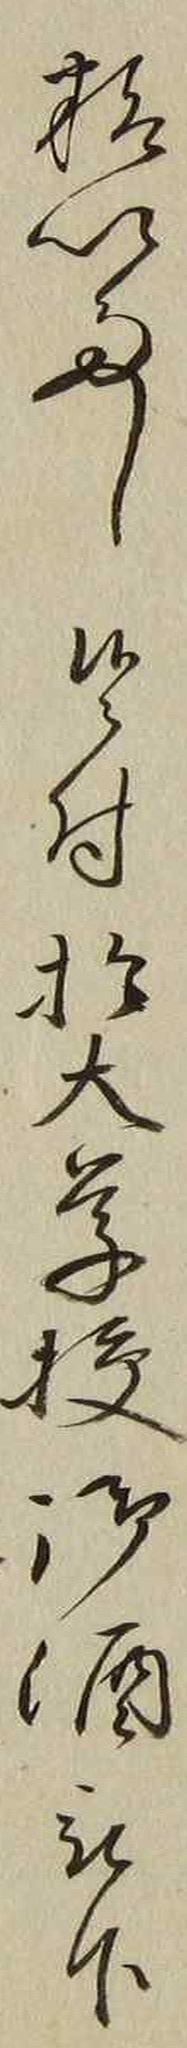精いたし候に付於大学校御酒被下
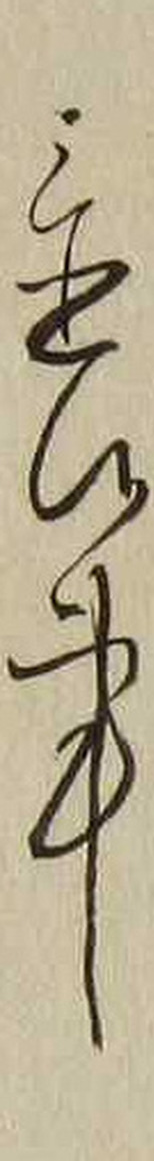置候事
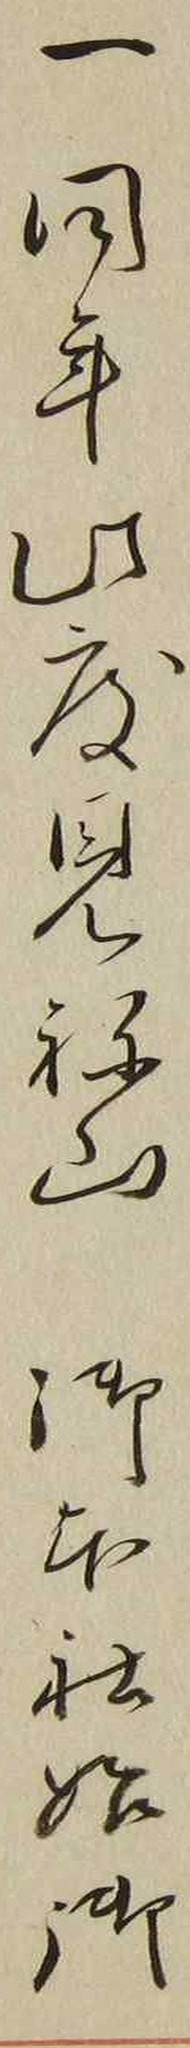一同年此度見祢山御本社始御

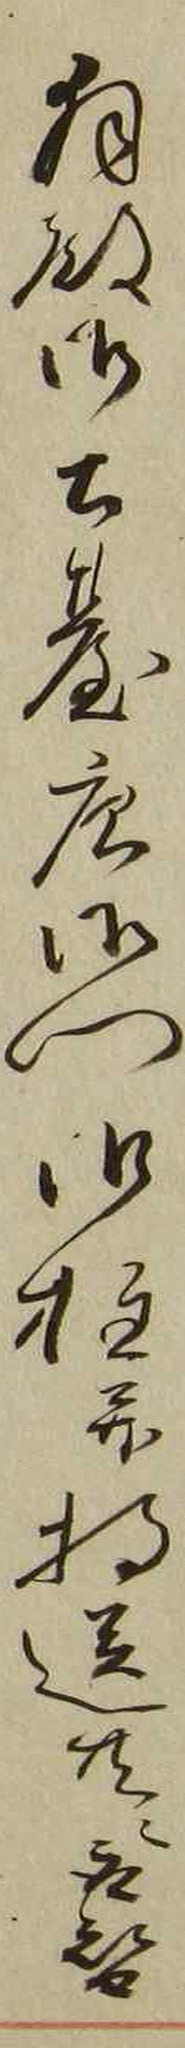拝殿御土台座御門御柱并持送共に取替
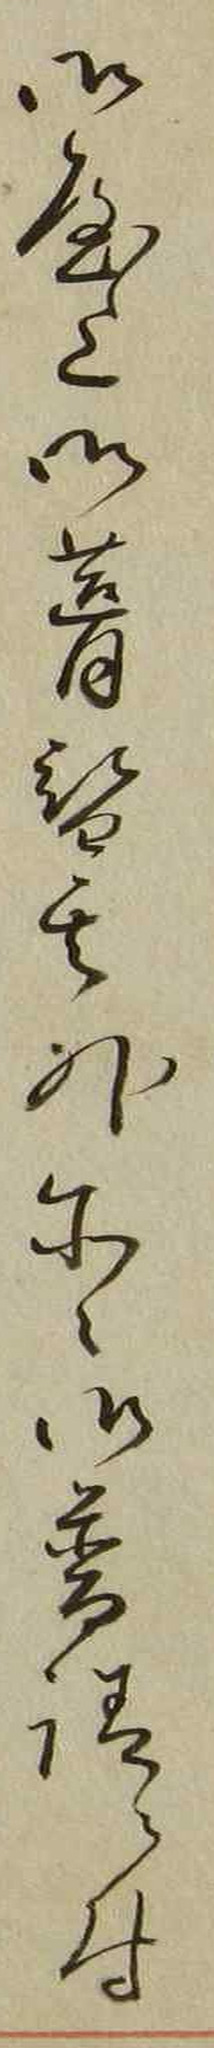御屋上御葺替其外所々御普請に付
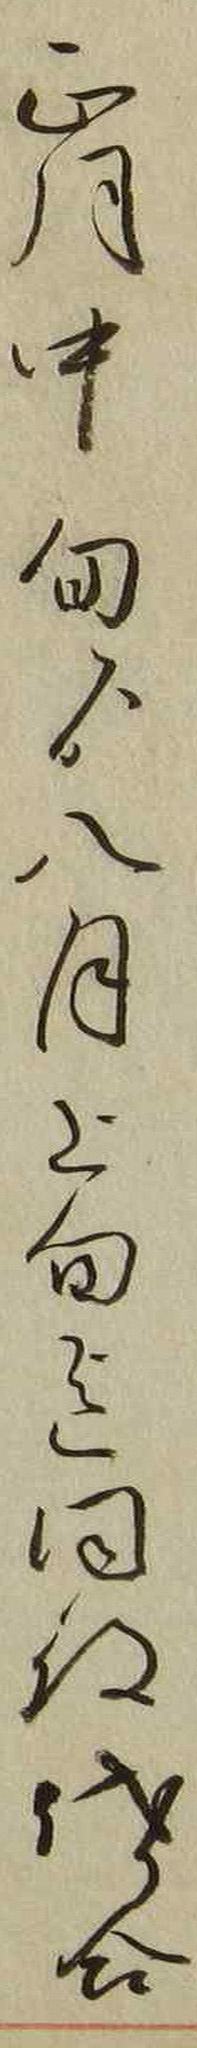正月中旬ゟ八月上旬迄同役代り合
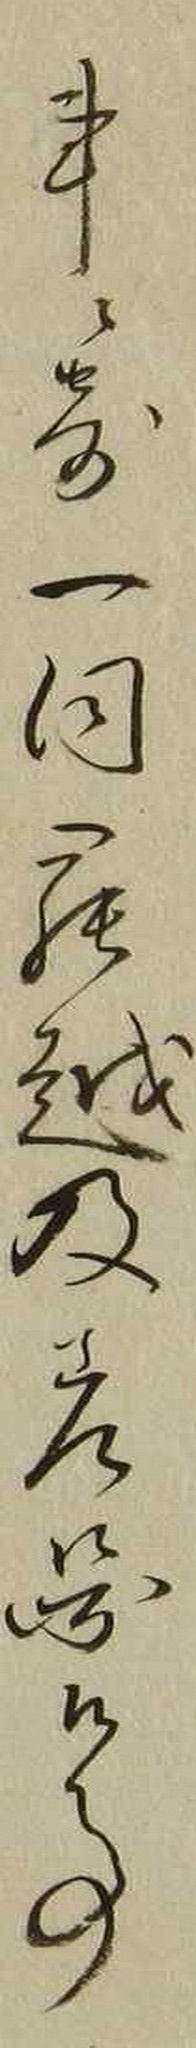事に寄一同罷越及差図候事
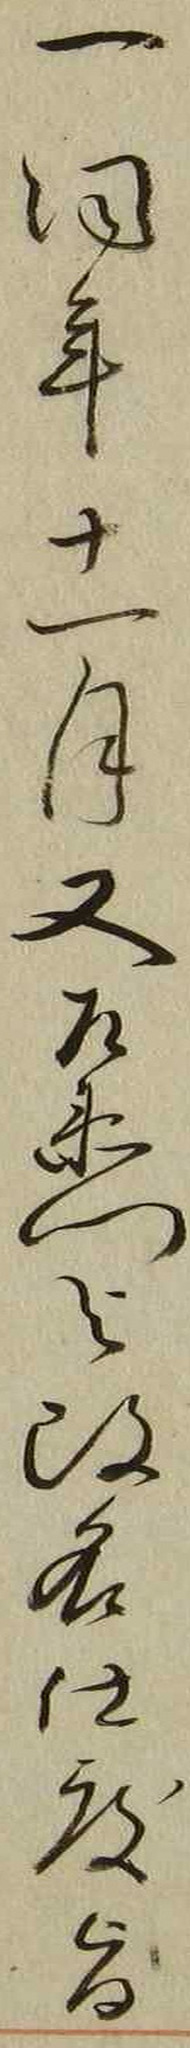一同年十一月又左衛門と改名仕度旨
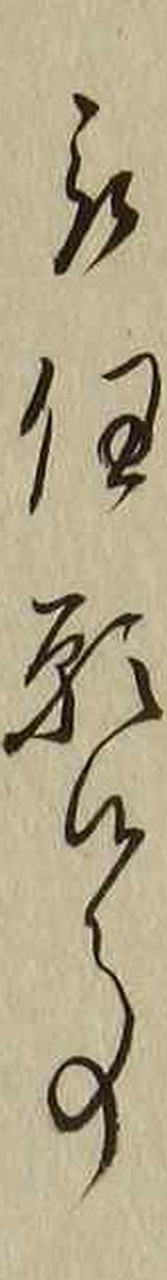被任願候事
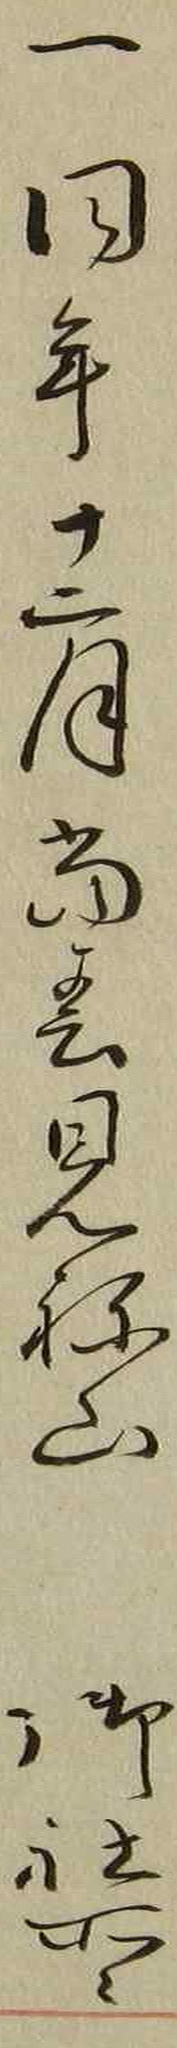一同年十二月当春見祢山御社所々
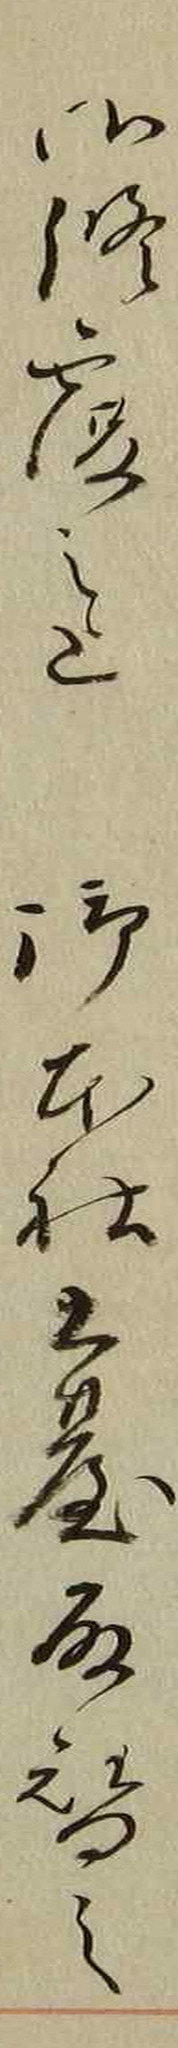御修覆之上御本社土台取替之
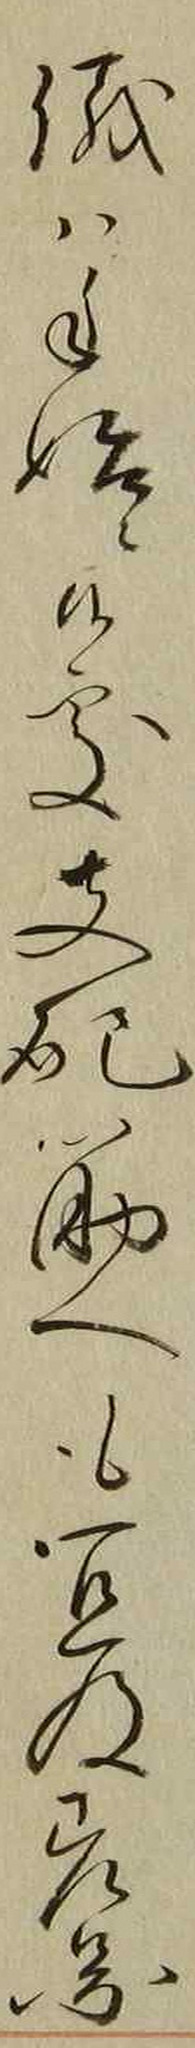儀は手始に候処支配筋へも宜及差図
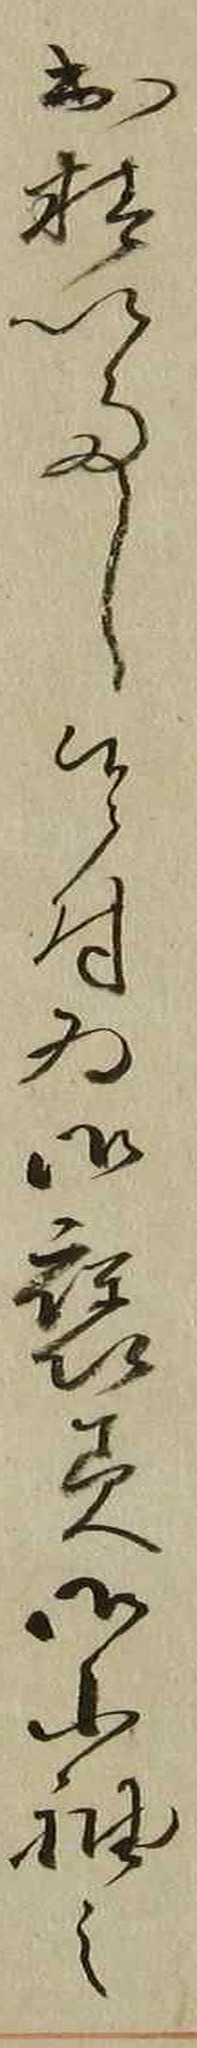出精いたし候に付為御褒美御小袖之
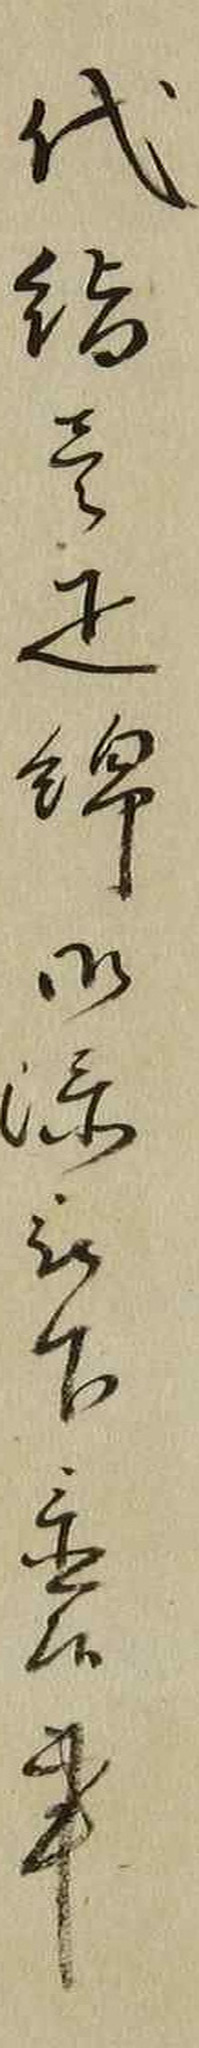代絹壱疋綿御添被下置候事
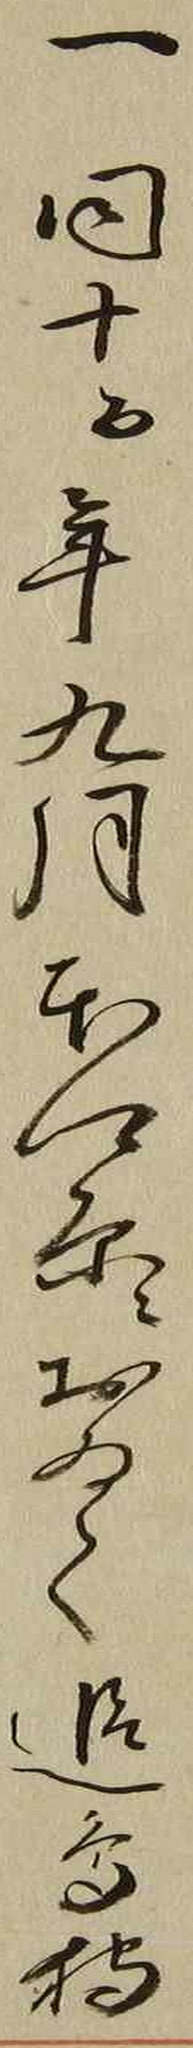一十酉年九月本郷原におゐて追鳥狩
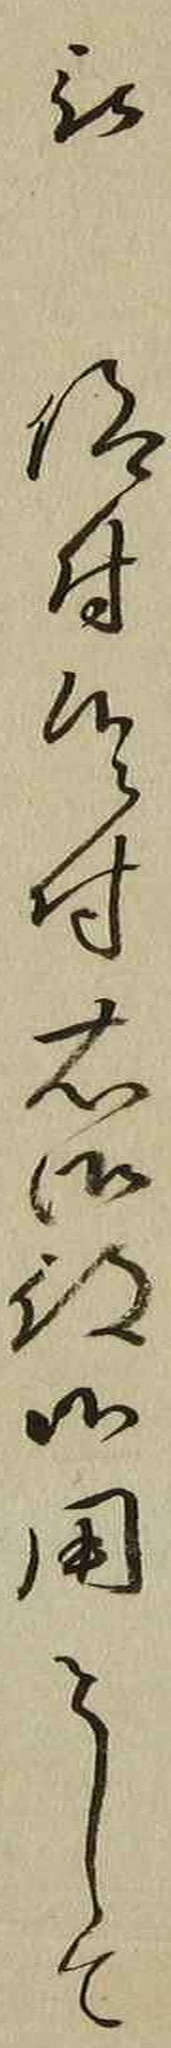被仰付候に付右御役御用として
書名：諸士系譜　巻之3　い之部3
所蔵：会津若松市立会津図書館
